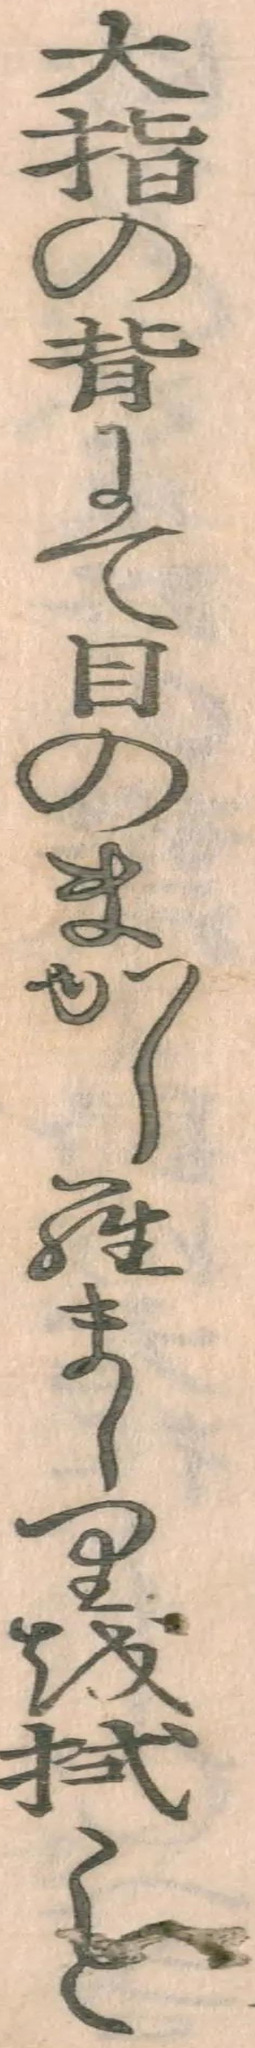大指の背にて目のまかしらましりを拭こと
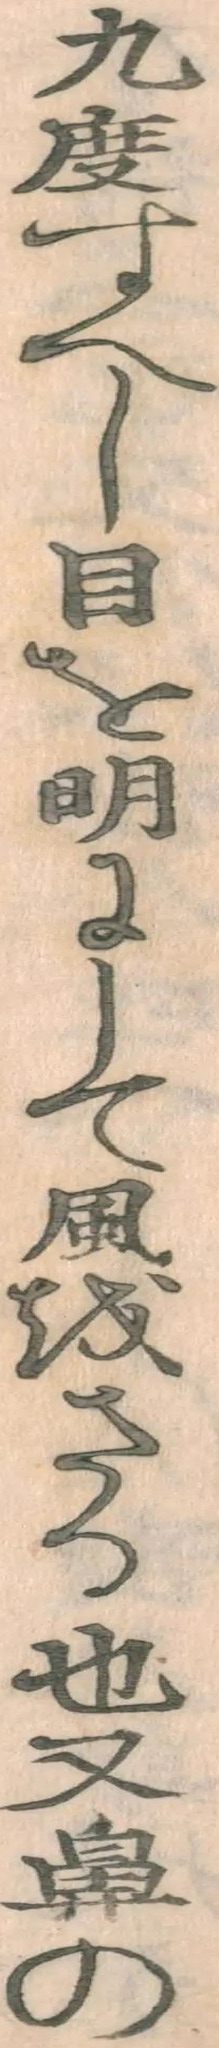九度すへし目を明にして風をさる也又鼻の
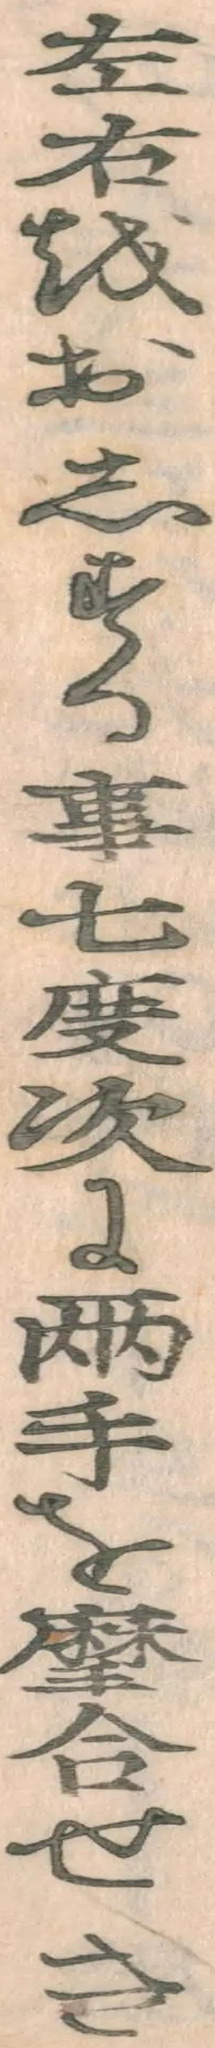左右をおしする事七度次に両手を摩合せき
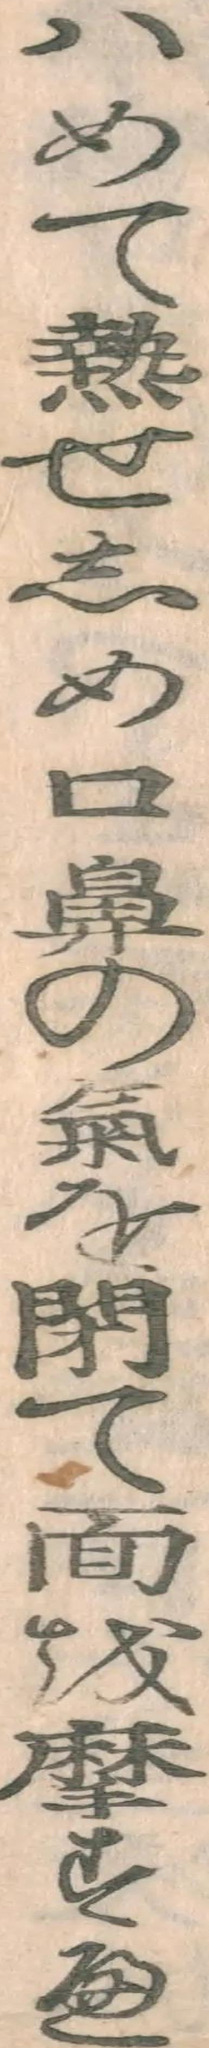はめて熱せしめ口鼻の気を閉て面を摩すへ
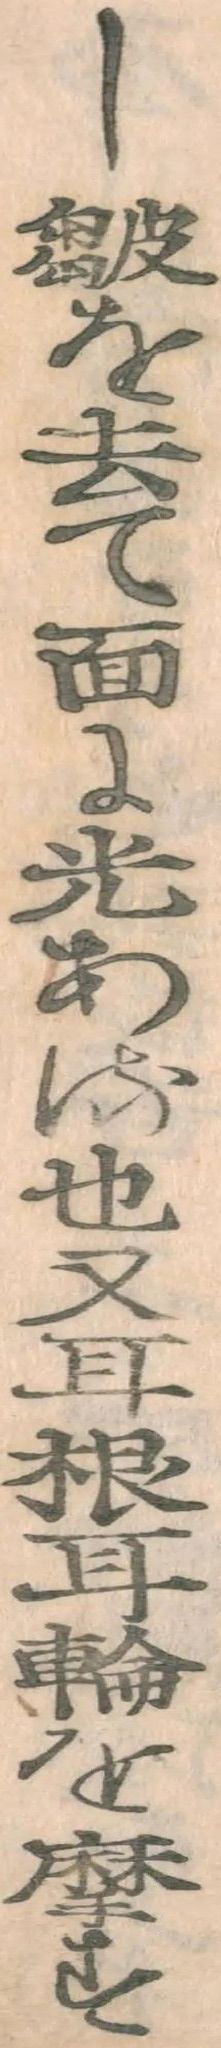し皺を去て面に光ある也又耳根耳輪を摩す

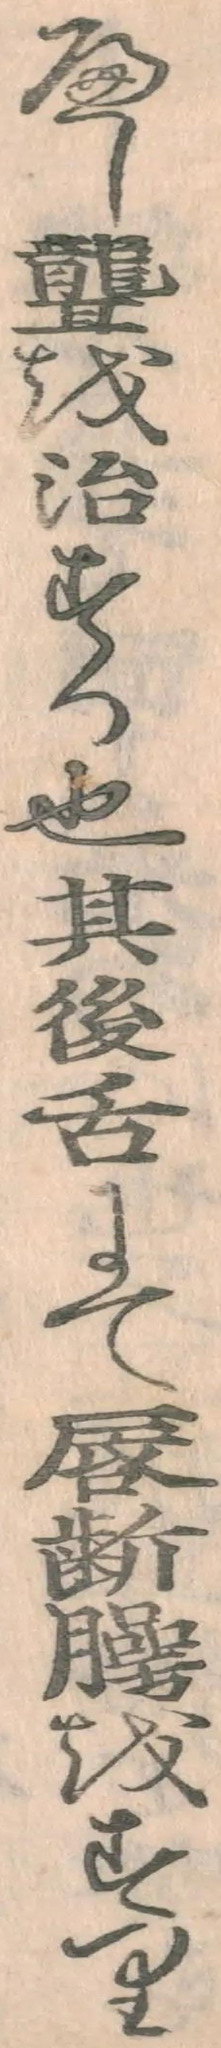へし聾を治する也其後舌にて唇齗㬽をすり
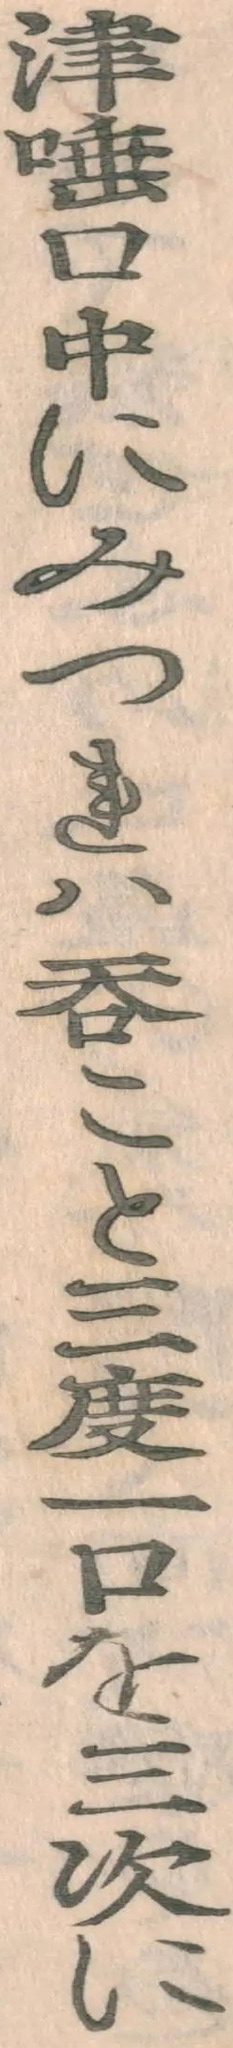津唾口中にみつれは呑こと三度一口を三次に
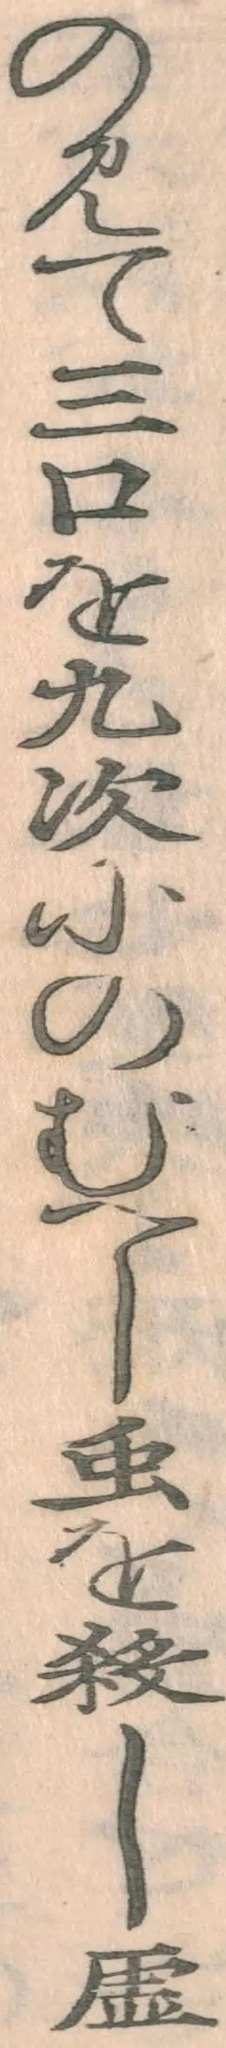のみて三口を九次にのむへし虫を殺し虚
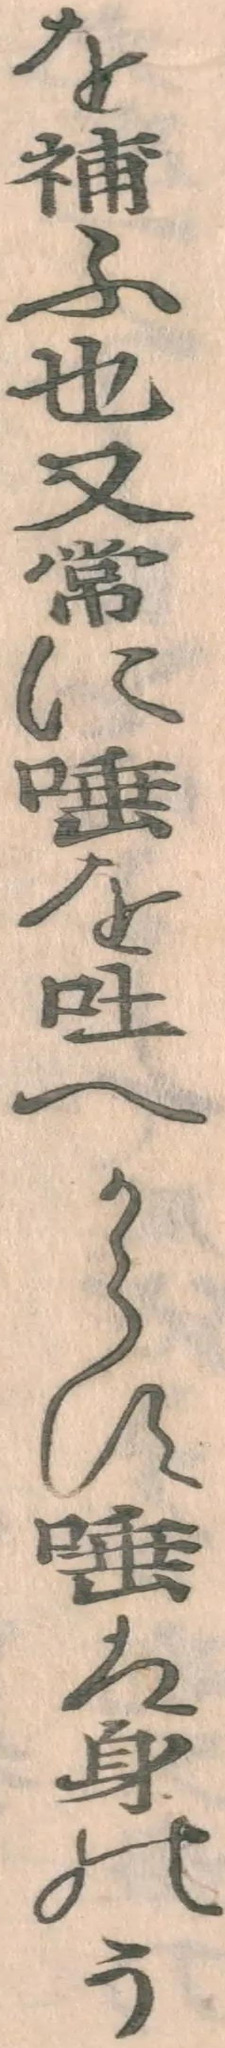を補ふ也又常に唾を吐へからす唾は身のう
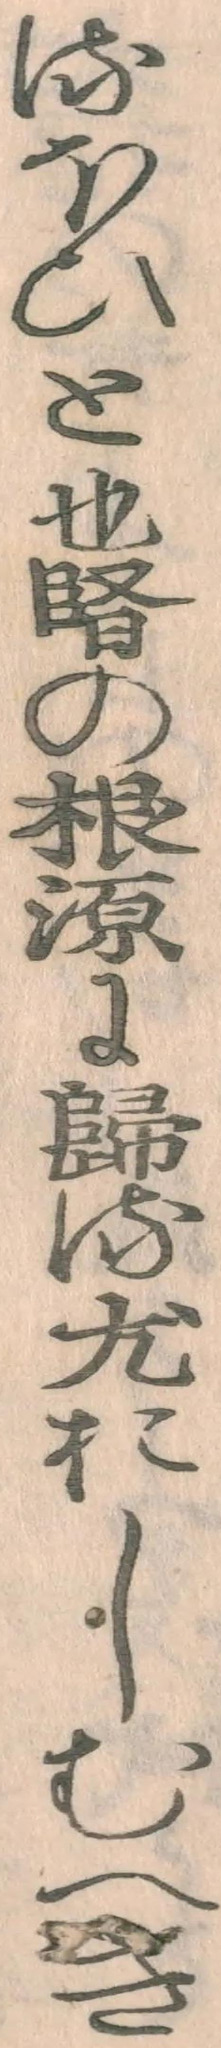るほひと也腎の根源に帰る尤おしむへき
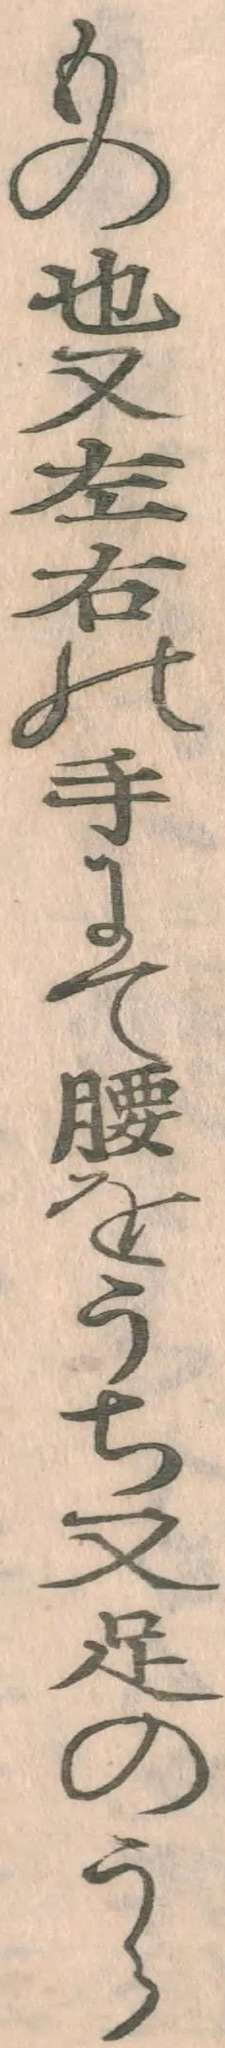もの也又左右の手にて腰をうち又足のうら
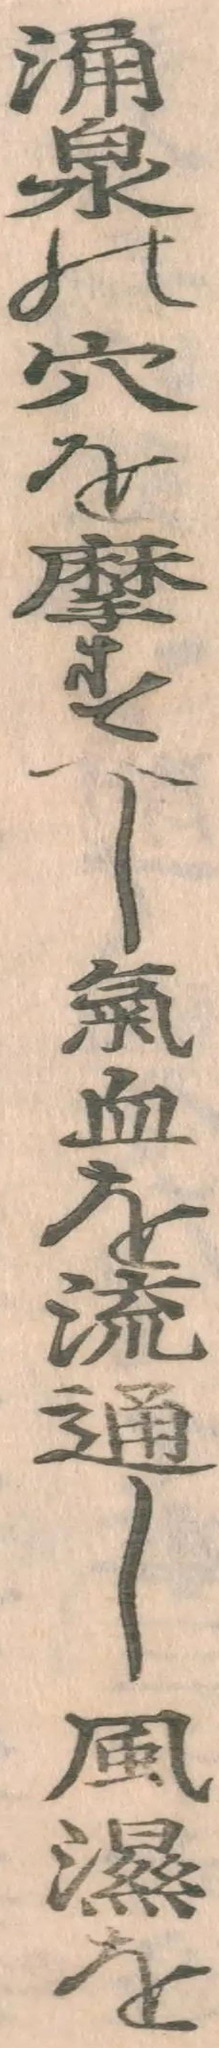涌泉の穴を摩すへし気血を流通し風湿を
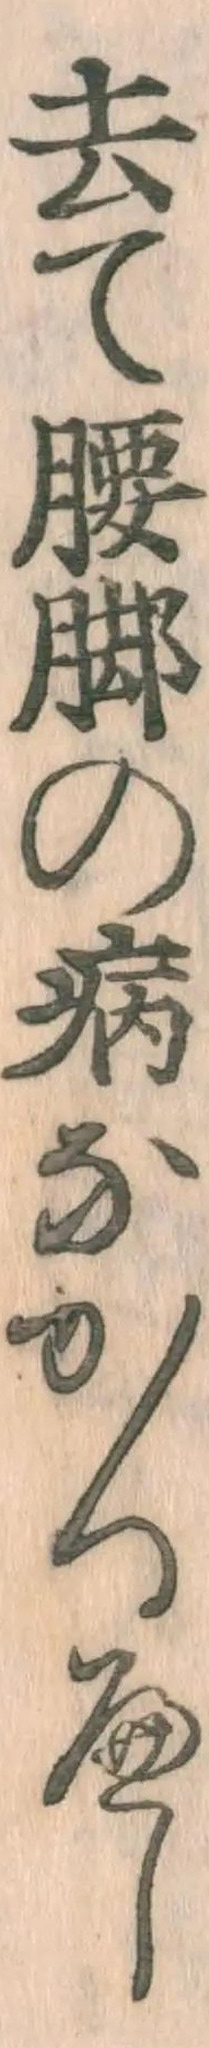去て腰脚の病なかるへし
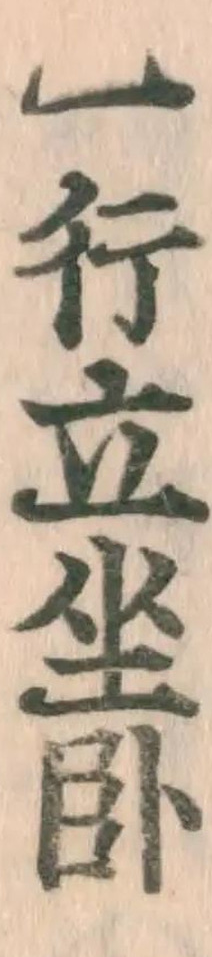一行立坐臥
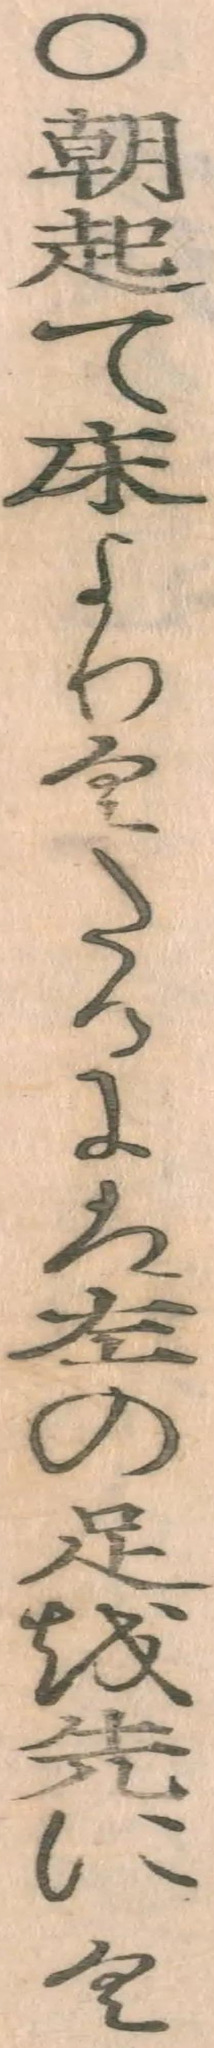〇朝起て床よりくたるには左の足を先にく
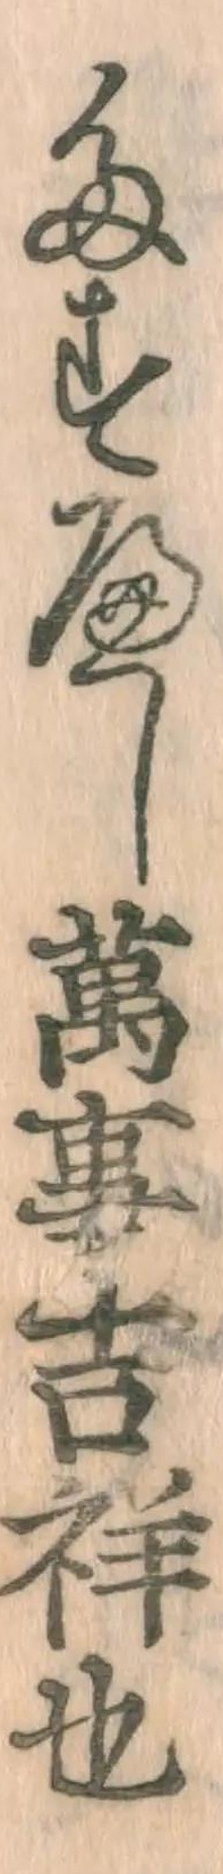たすへし万事吉祥也
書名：延壽撮要
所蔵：国立国会図書館 National Diet Library, JAPAN
